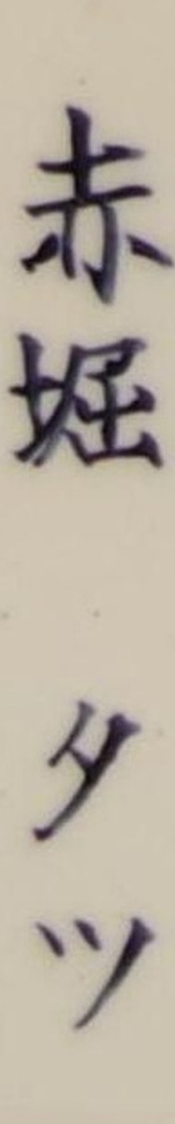赤堀タツ
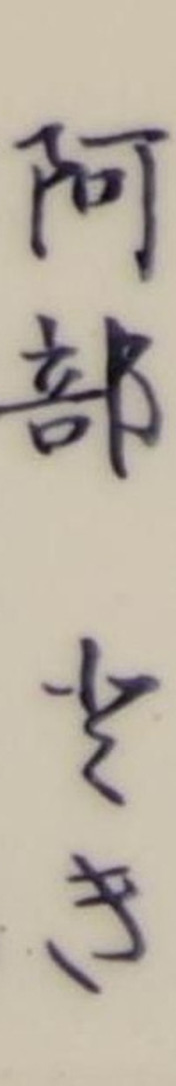阿部とき
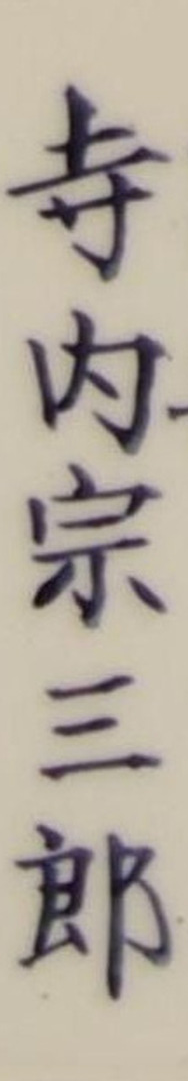寺内宗三郎
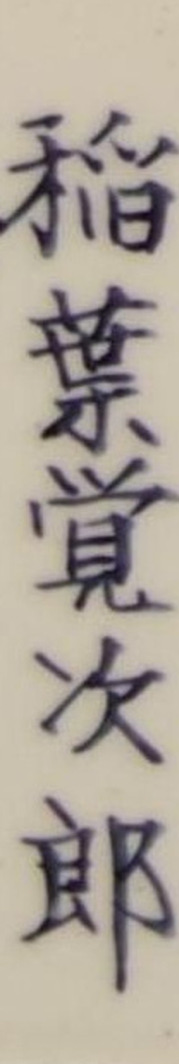稲葉覚次郎
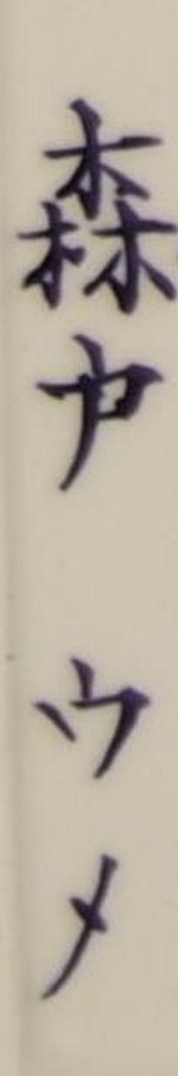森戸ウメ

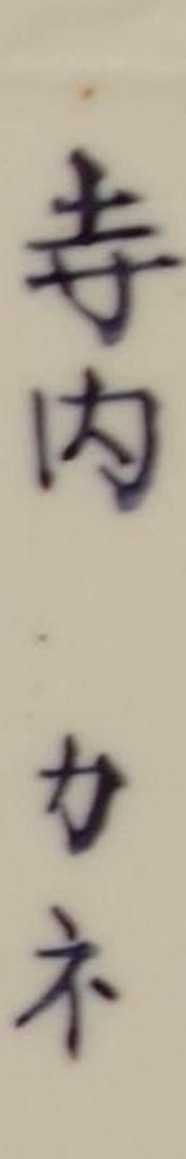寺内カネ
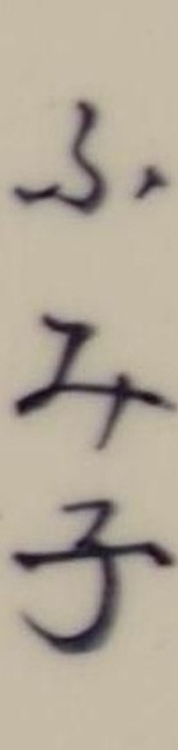ふみ子
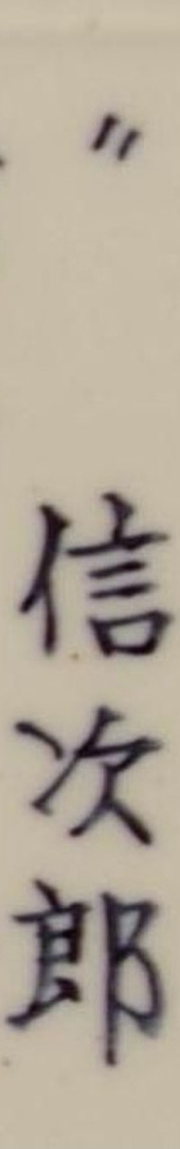信次郎
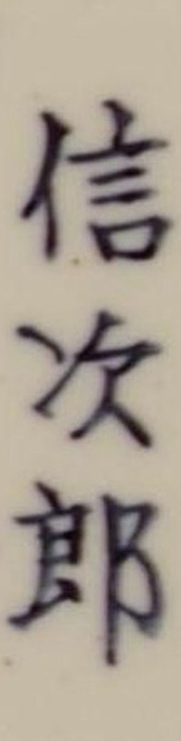信次郎
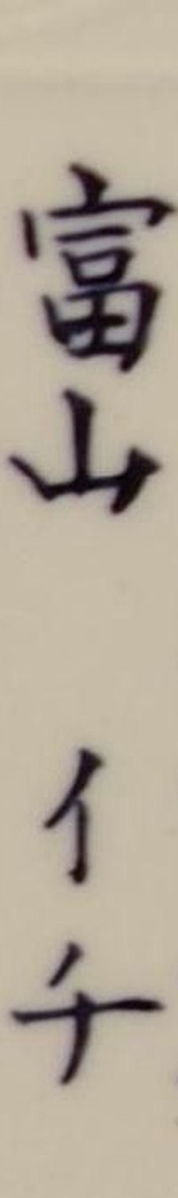富山イチ
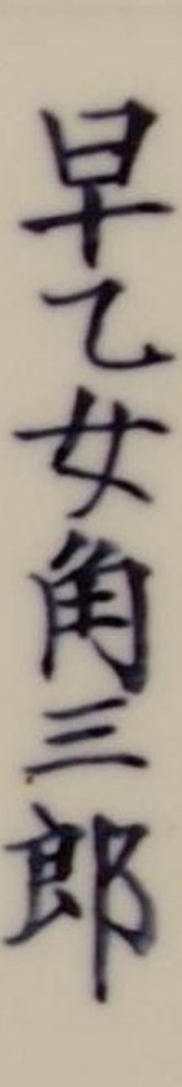早乙女角三郎
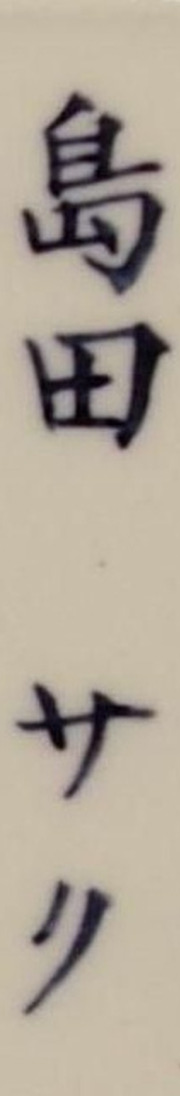島田サク
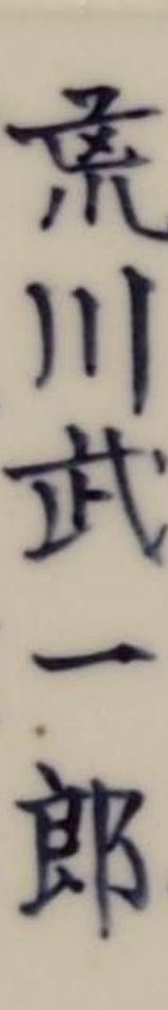荒川武一郎
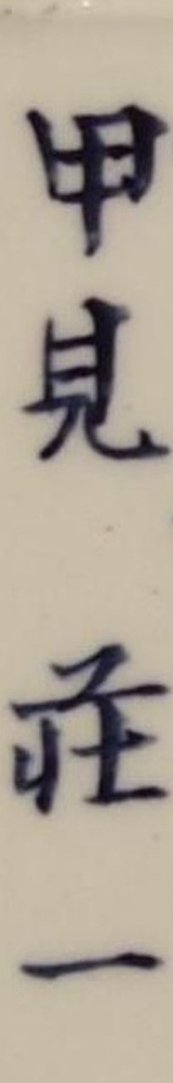甲見荘一
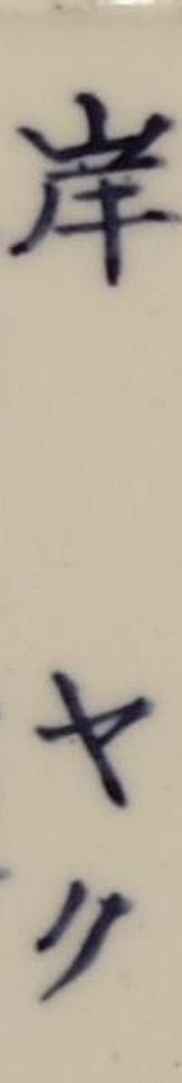岸ヤク
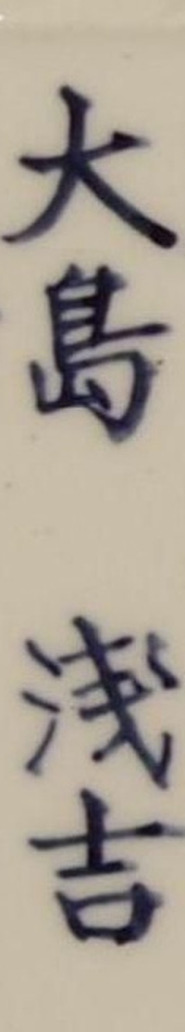大島浅吉
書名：E~L
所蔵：高野山金剛峯寺
